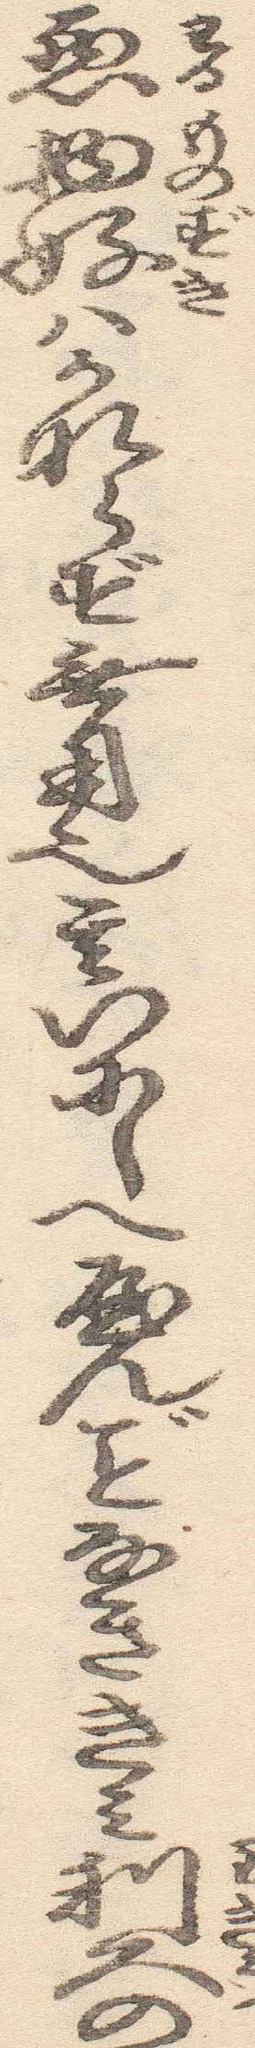悪物好はかならず無用也其いにしへやんごとなききみ利久の
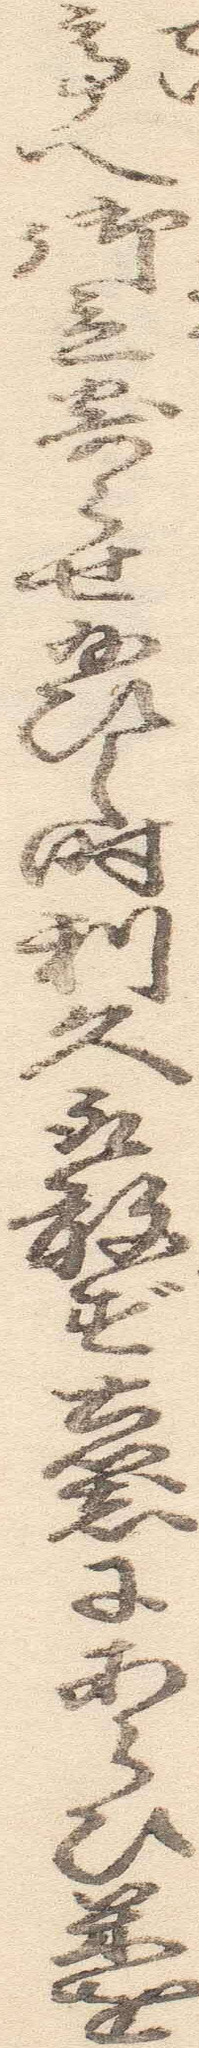亭へ御立寄らせ給ひし時利久取敢ず土器にあらひ米を
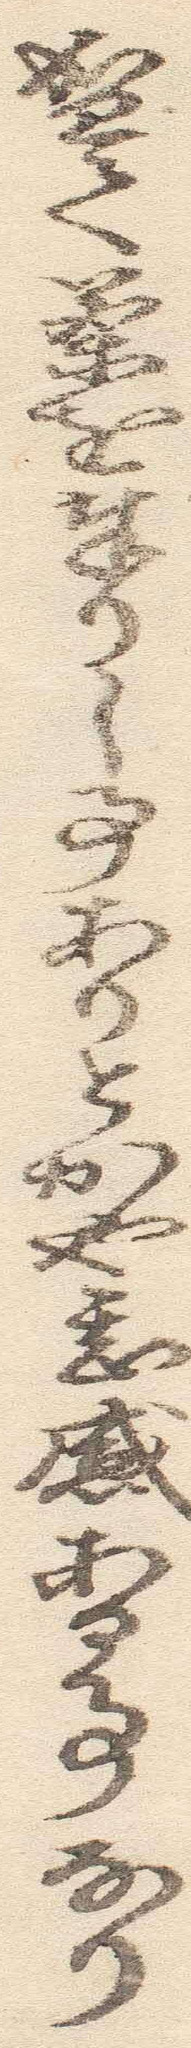盛て茶を奉りし事ありとかや甚感ある事なり
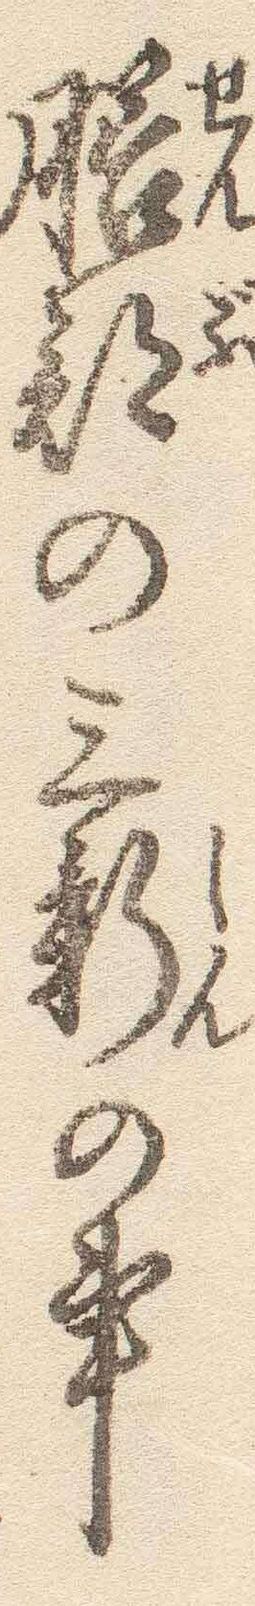膳部の三新の事
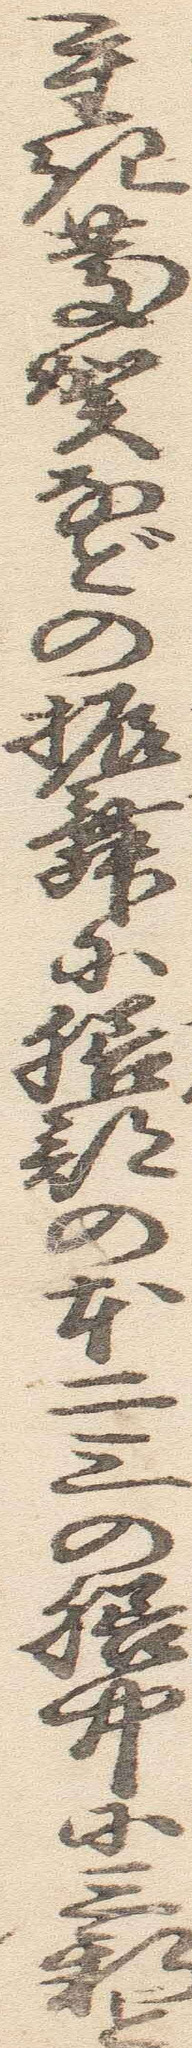一重き慶賀などの振舞に膳部の本二三の膳中に三新と
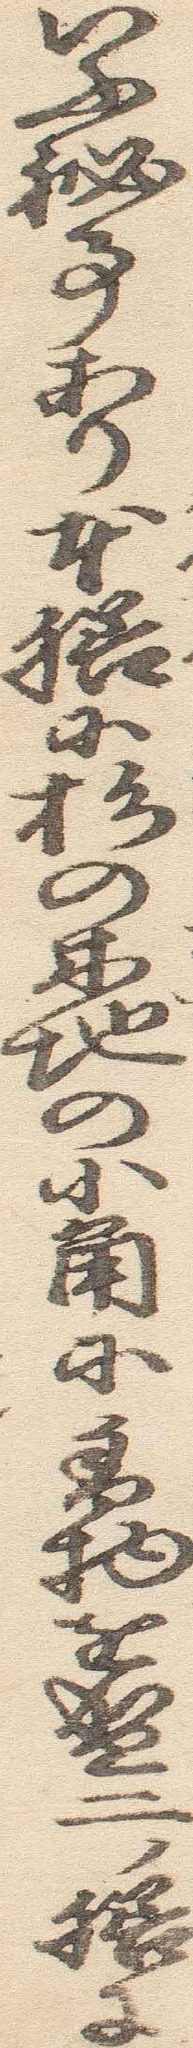いふ秘事あり本膳に杉の木地の小角に香物を盛二膳に
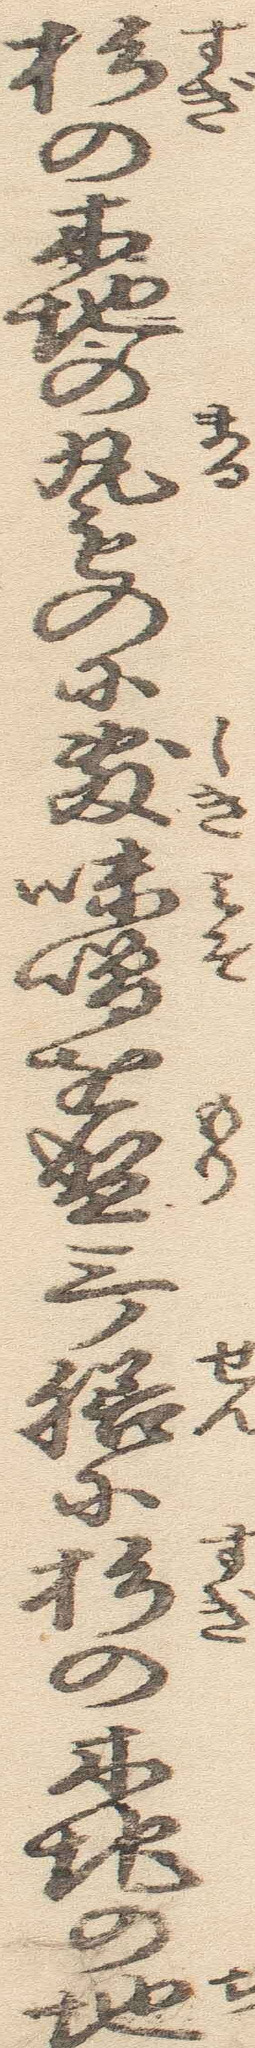杉の木地の丸ものに敷味噌を盛三膳に杉の木地の地
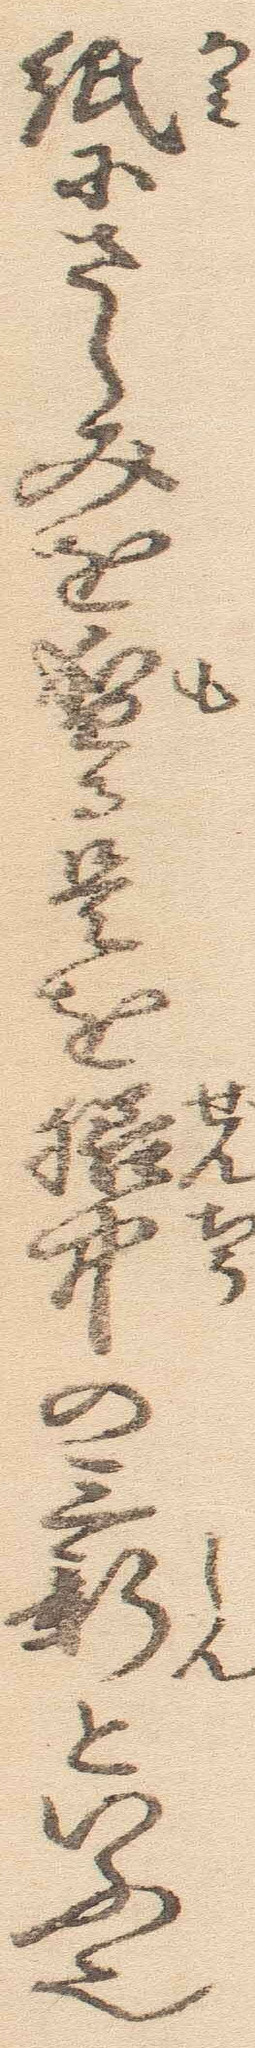紙にさしみを盛る是を膳中の三新といふ也

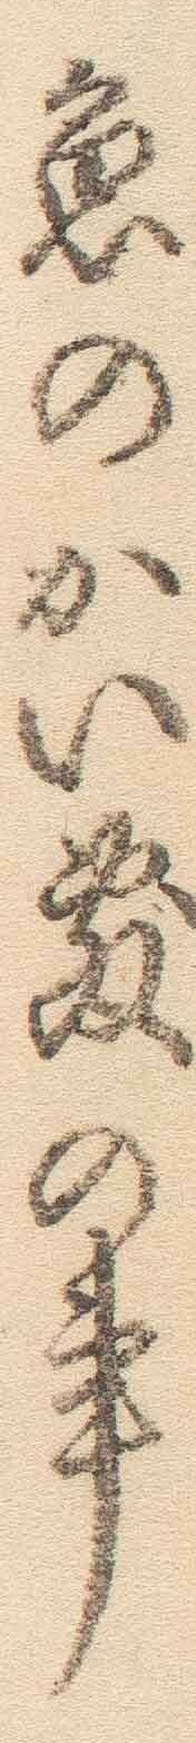魚のかい敷の事
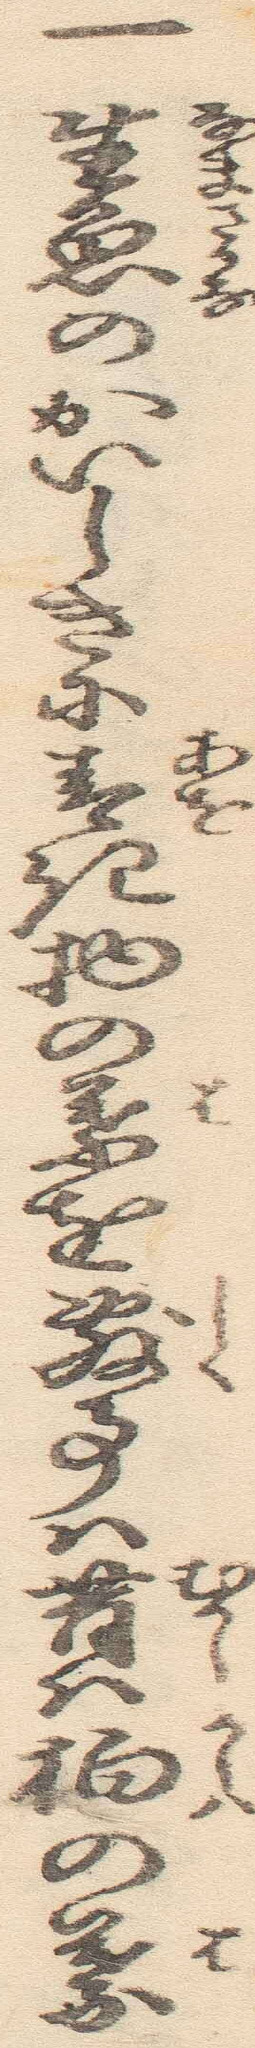一生魚のかいしきに青き物の葉を敷事は昔は柏の葉
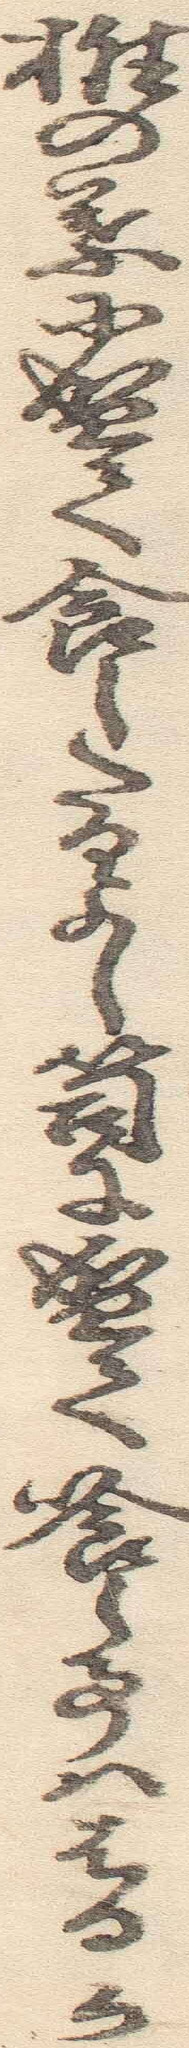椎の葉に盛て食したるよし笥に盛て喰し事ははるか
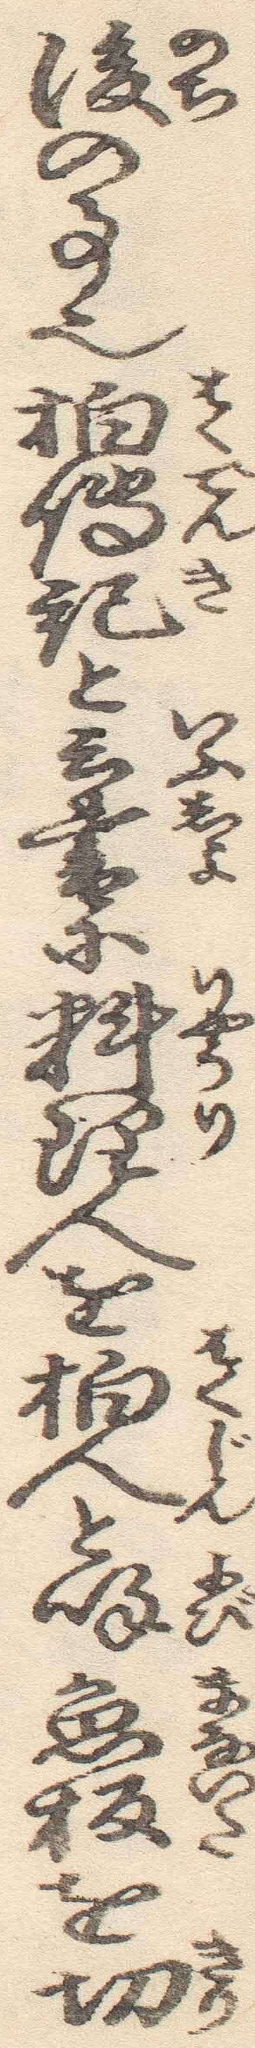後の事也柏伝記と云書に料理人を柏人と呼魚板を切
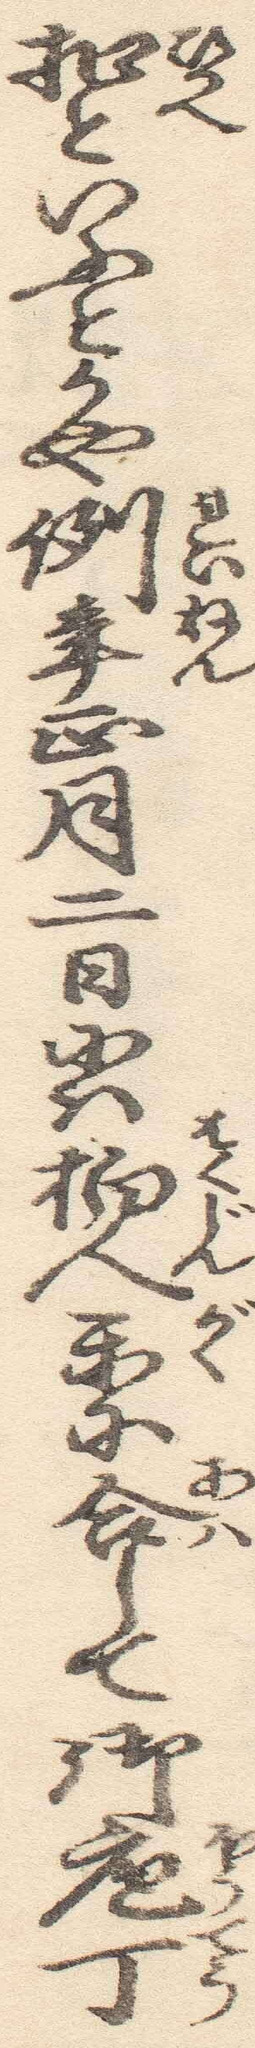扣といふとかや例年正月二日には柏人楽に合して御庖丁
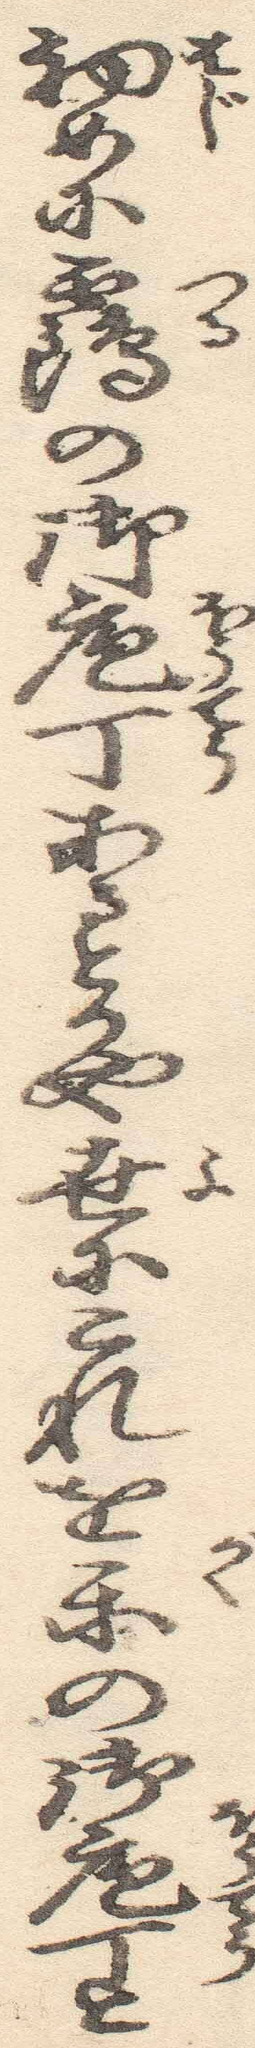初めに鶴の御庖丁あるとかや世にこれを楽の御庖丁と
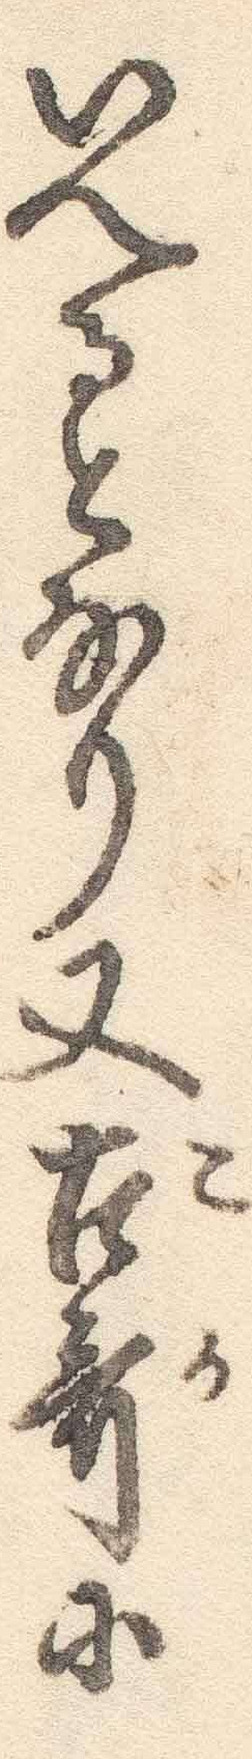いへるとなり又古哥に
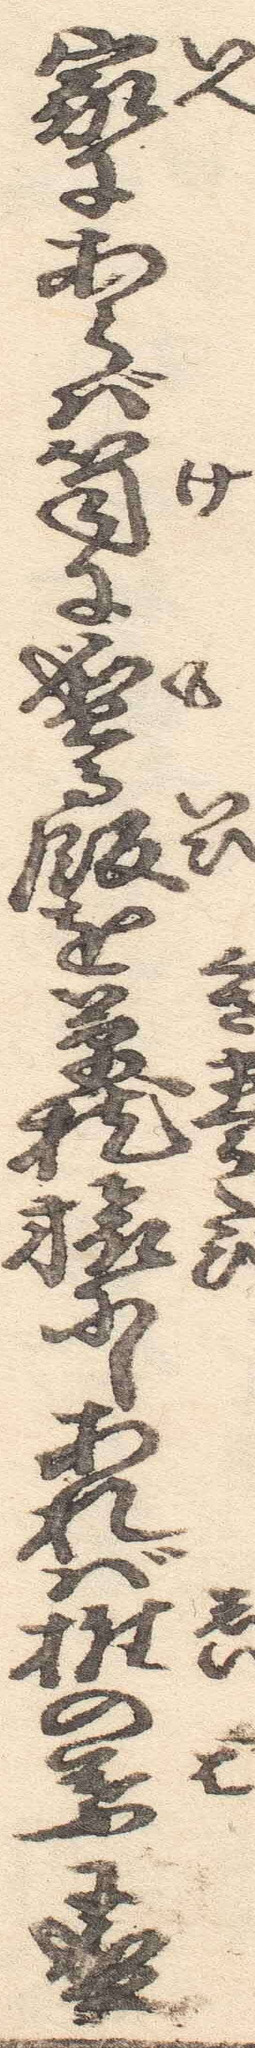家にあらば笥に盛る飯を草枕旅にしあれば椎の葉に盛
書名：料理通
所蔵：東京学芸大学附属図書館 国文学研究資料館
